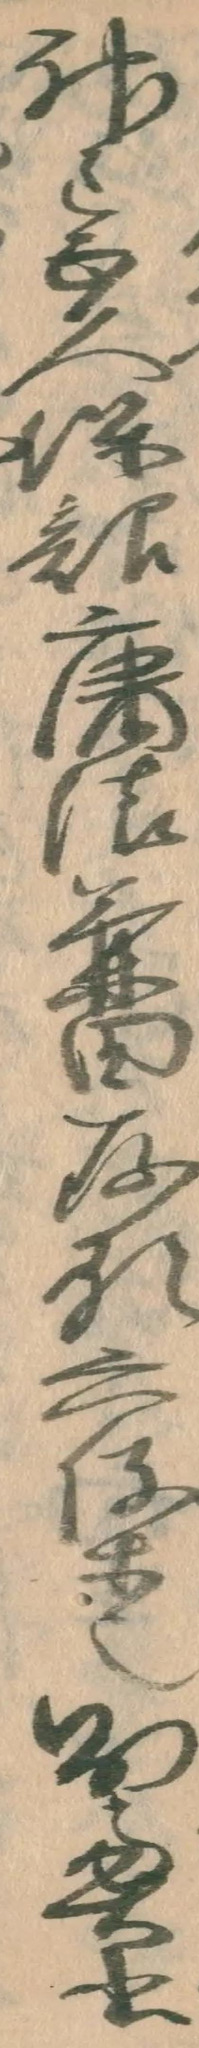神主正久保韶庸清兼田存顕六役等也則奥書
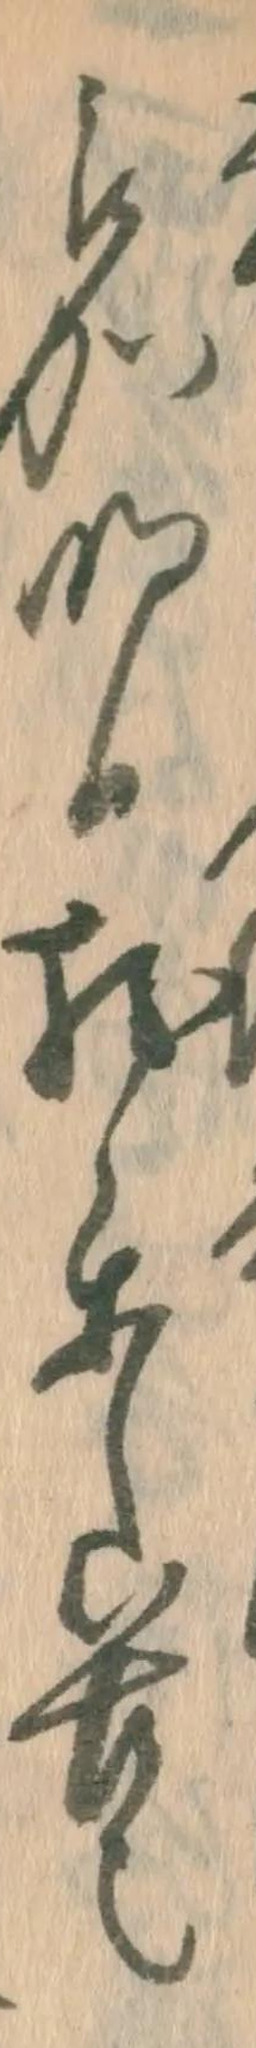被加明日持参之筈也
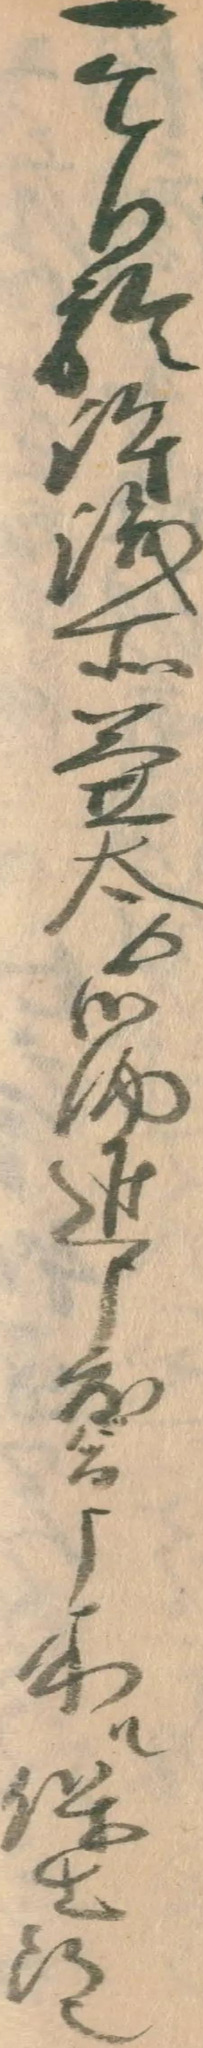一今日於評議所兼太ゟ御納進申度旨申来ル保土行也
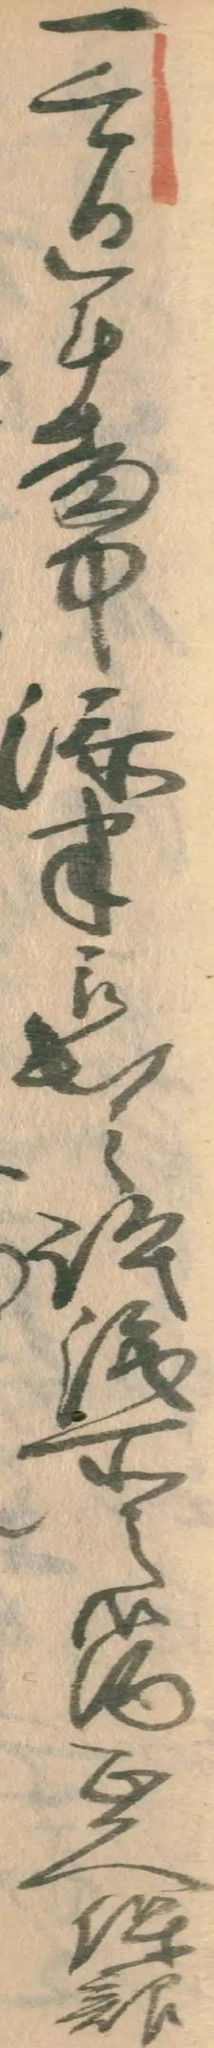一今日年番中添被出之評議所之御酒正久保韶
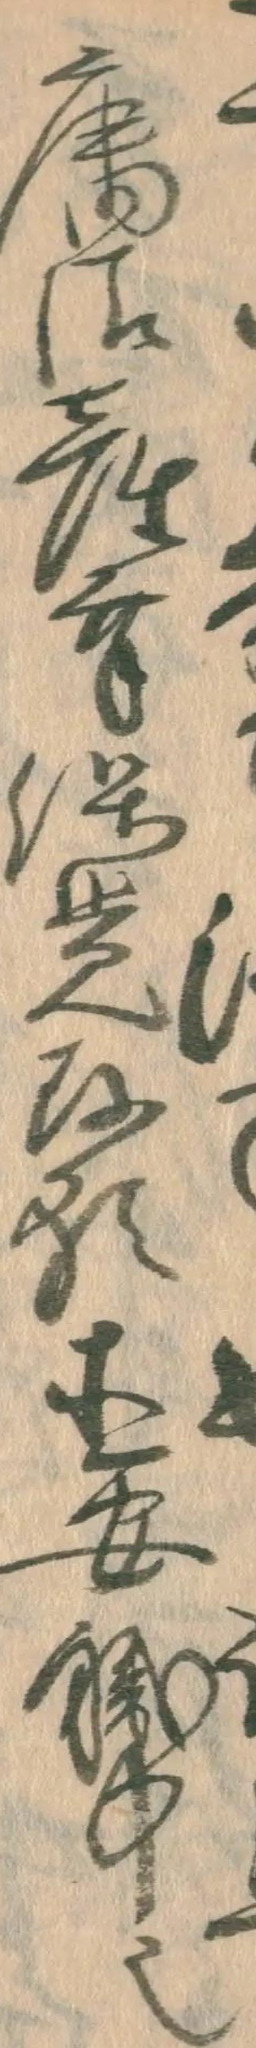庸清産幸保覚存顕直安職中也
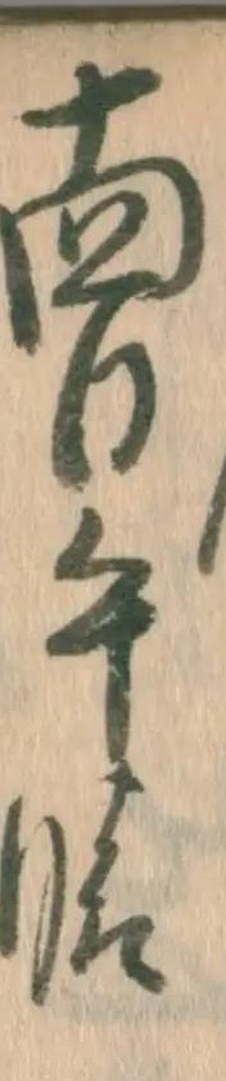十四日午晴
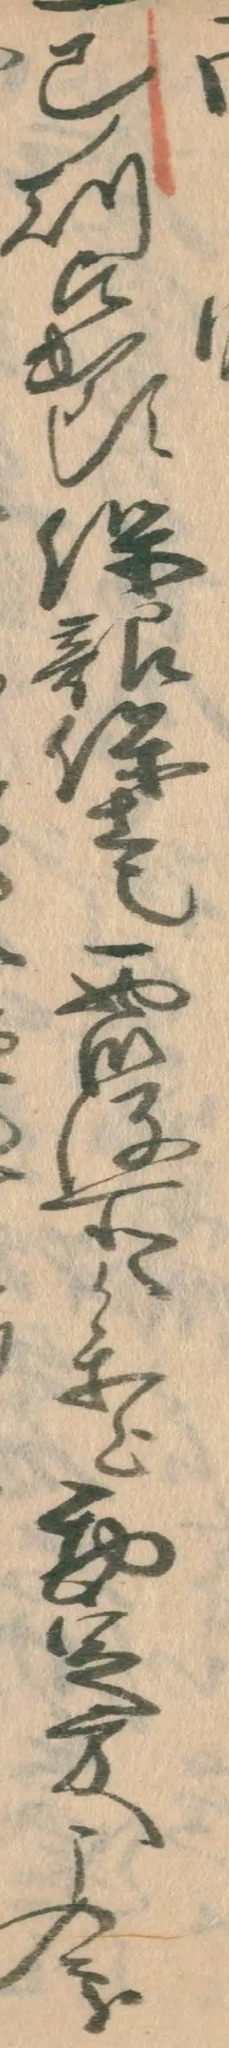一巳ノ刻比出頭保韶保土也西御役所へ参上勘定方へ申入候処
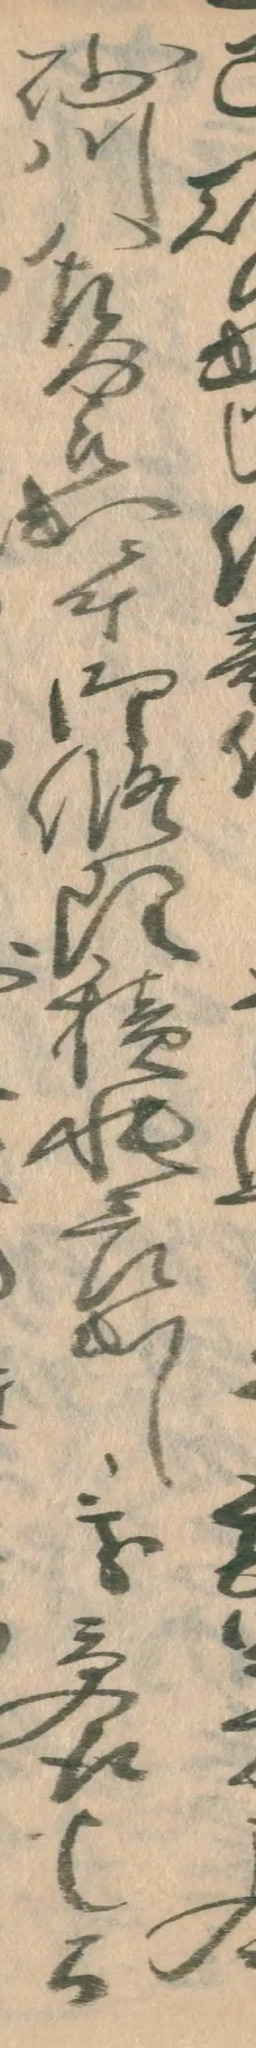砂川八左衛門被出ニ付御修理積帳差出し候処受取申候而
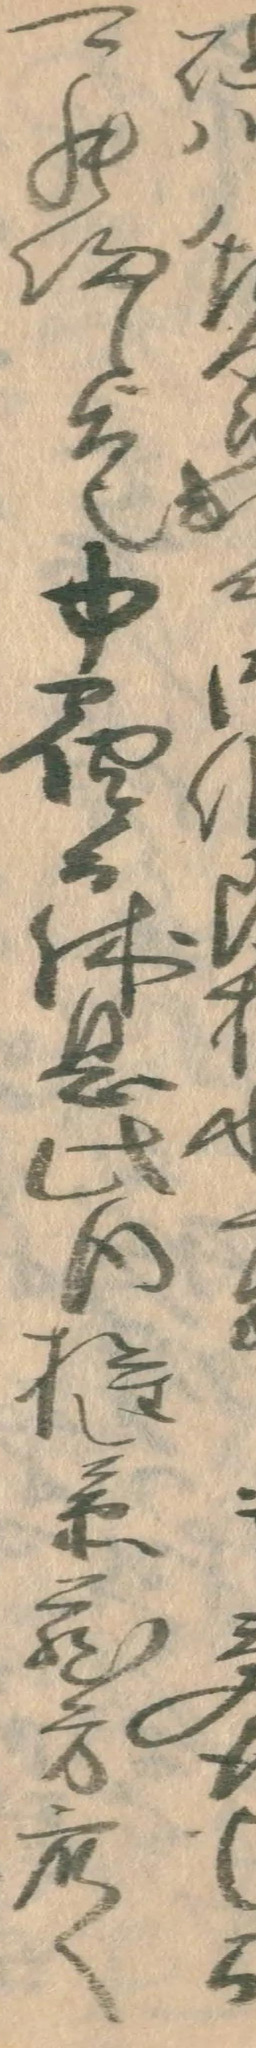可罷帰旨也中宿ニ而休息此内権兵衛蔵方衆へ
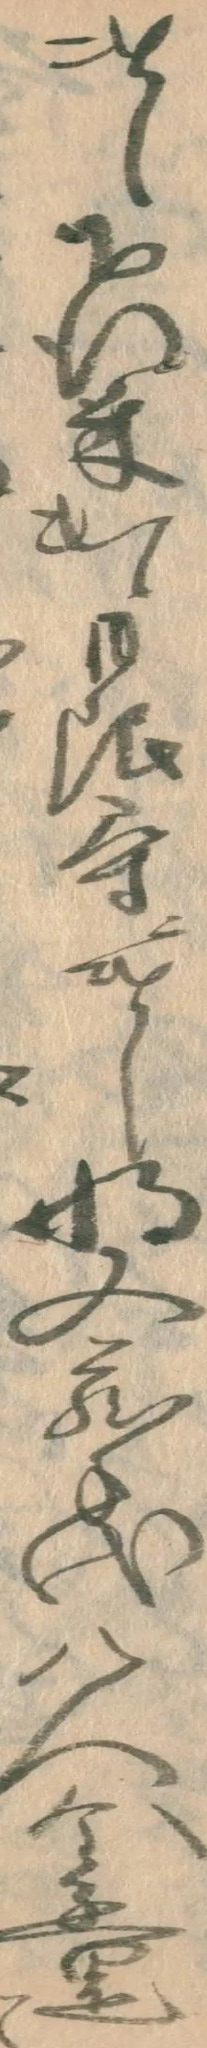咄し下行米出候日限尋ニ遣し候将又蔵手代八人へ金子百疋ツヽ
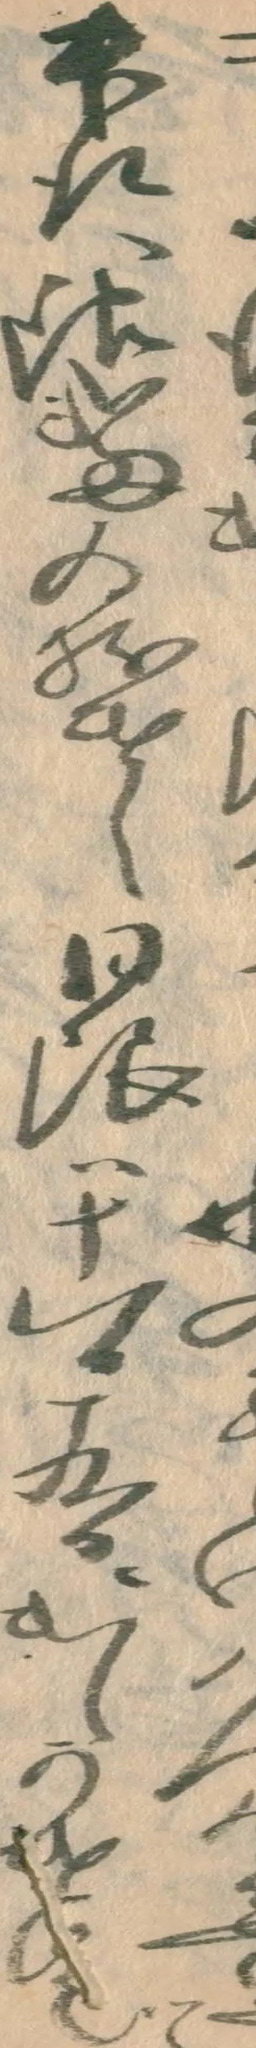升取へ銀弐両為持遣し日限ハ十八日十九日ニ出し可然旨也
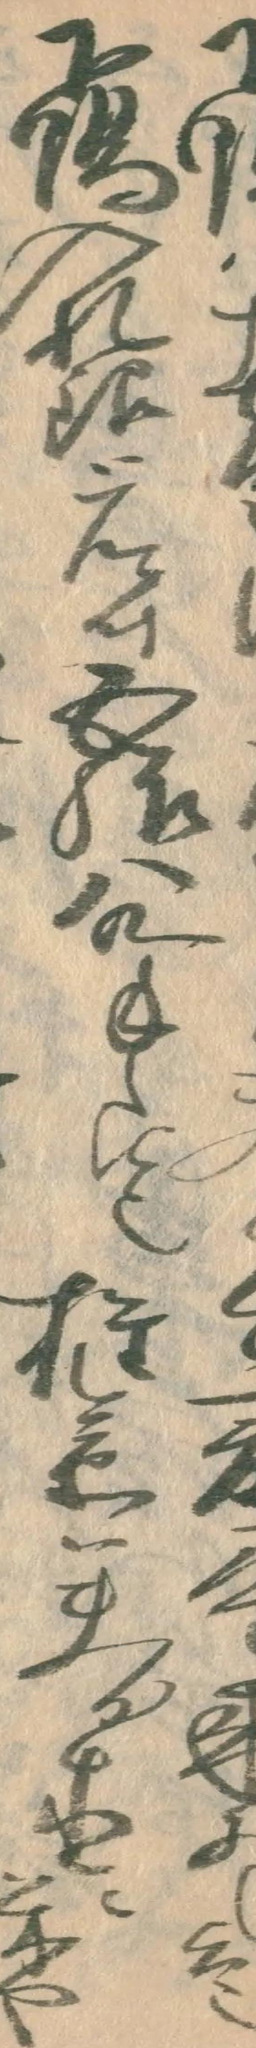下鴨入札銀ハ石ニ付五拾八九匁之由也権兵衛ハ夫ゟ直ニ米や
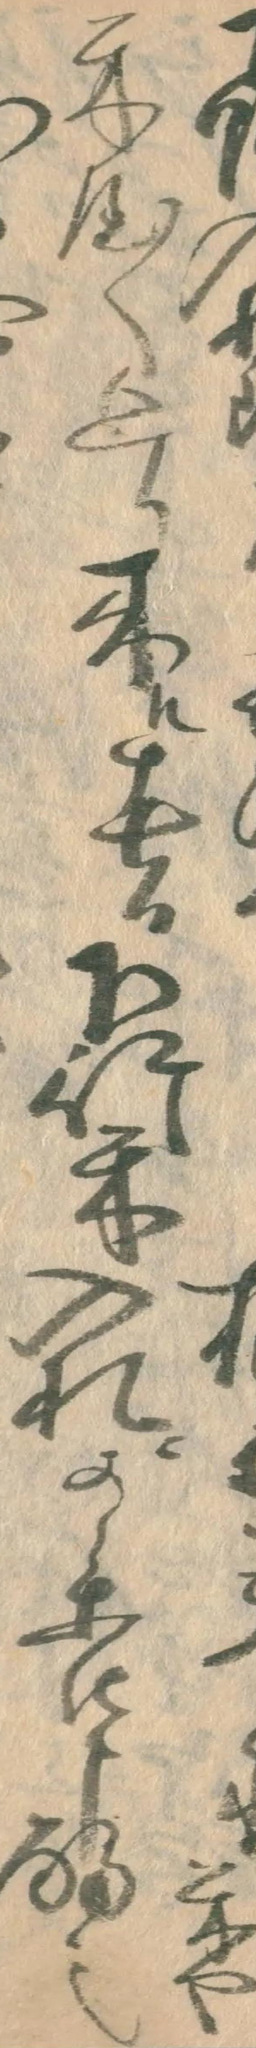米屋へ廻り来ル十七日下行米入札ニ可参由申触候也
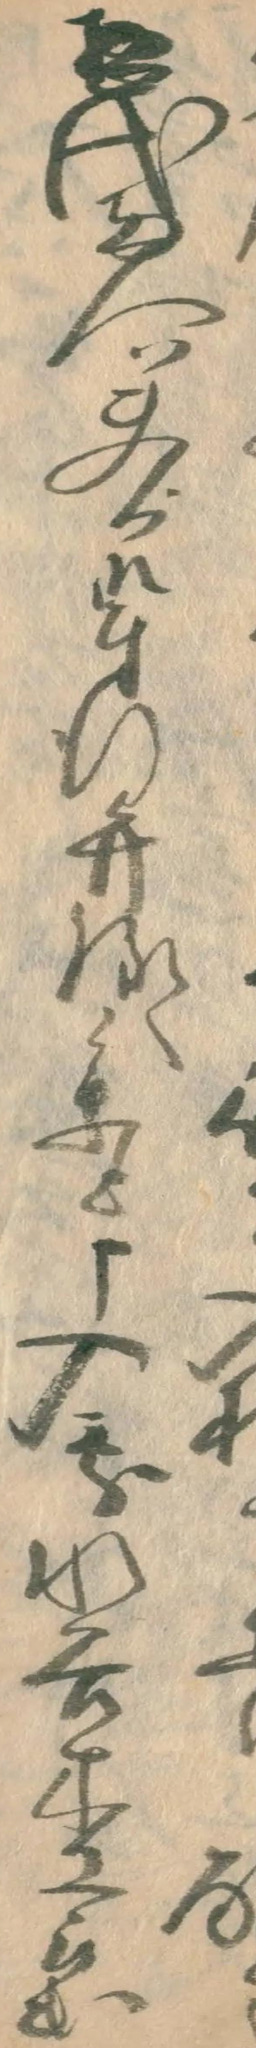惣代両人ハ夫ゟ御奉行弁様へ参上申入処水谷木工被出

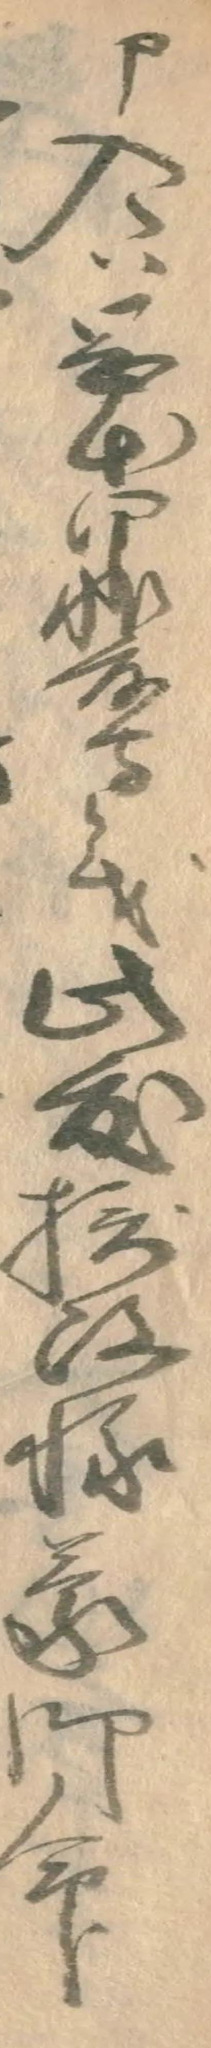申入候ハ岡本甲斐守之義此度摂政様蒙御命
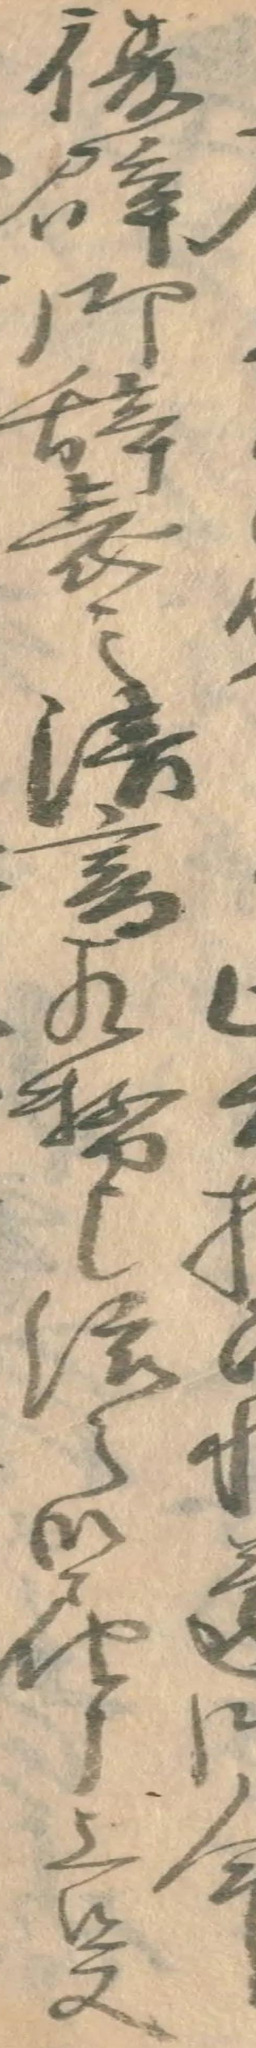復辞御辞表之請書相務申候依之御届申上且又
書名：賀茂社記録. 第60冊
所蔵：国立国会図書館 National Diet Library, JAPAN
